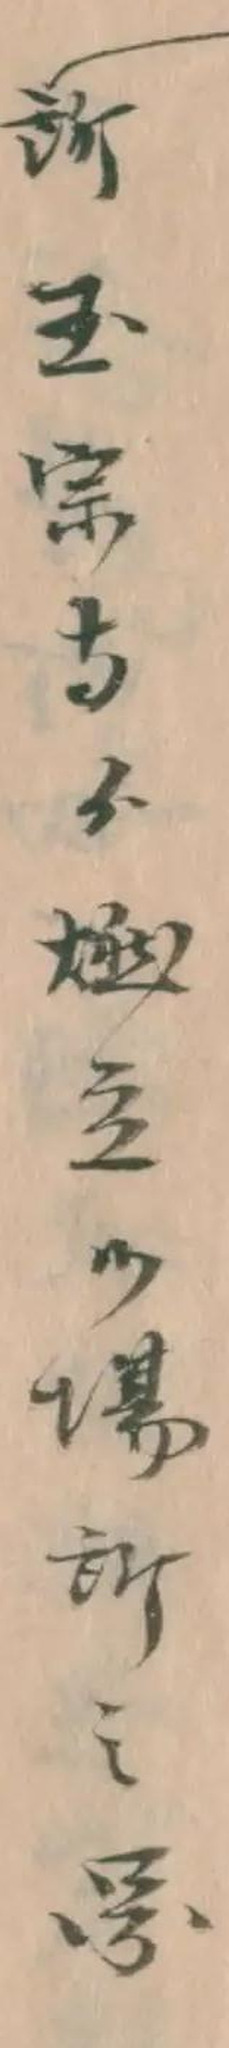所玉宗寺より燃立候場所之図
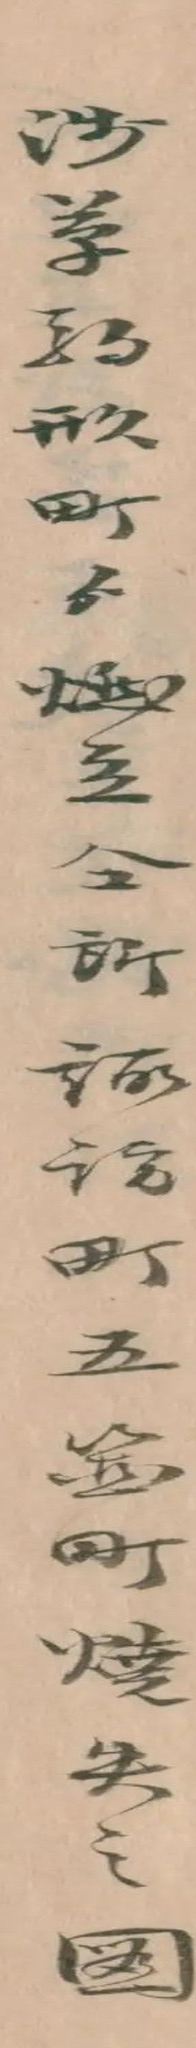九浅草駒形町ゟ燃立仝所諏訪町五箇町焼失之図
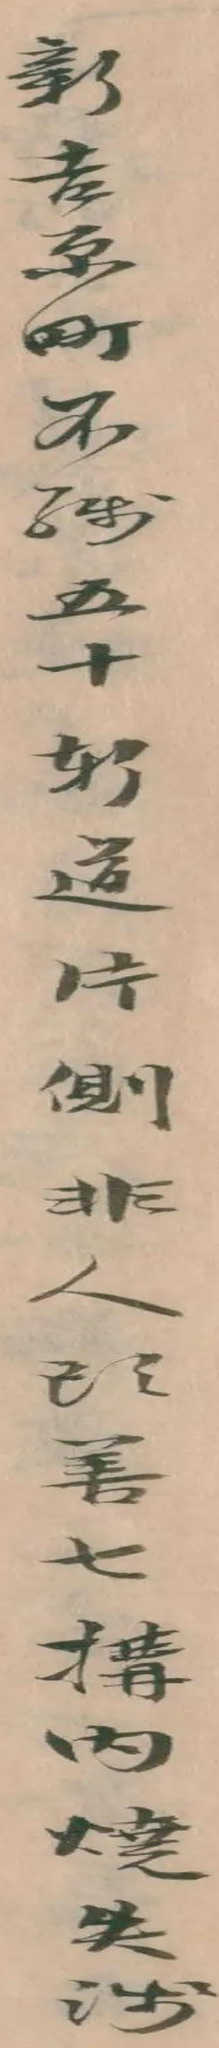十新吉原町不残五十軒道片側非人頭善七構内焼失浅
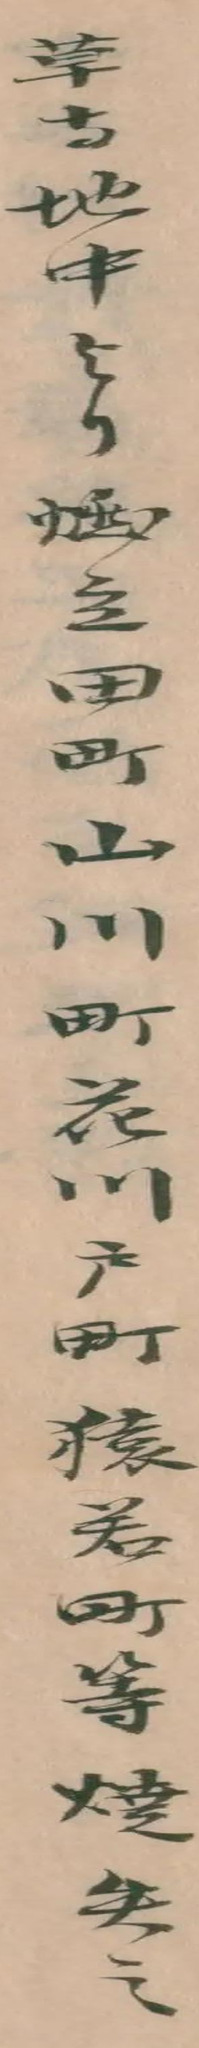草地中ゟ燃立田町山川町花川戸町猿若町等焼失之
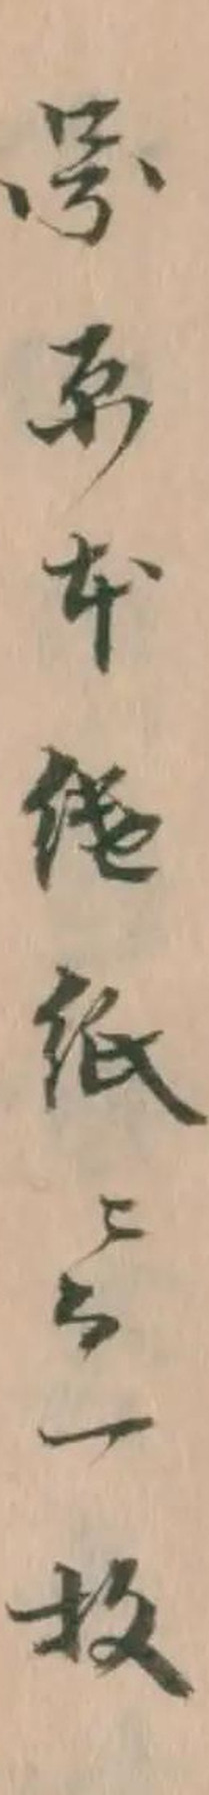図原本繾紙にて一枚
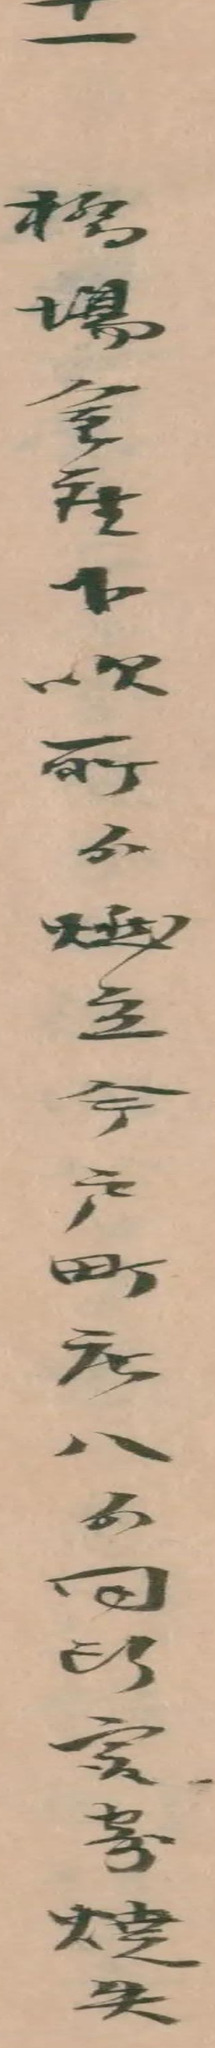十一橋場金座下吹所ゟ燃立今戸町庄八ゟ同所最寄焼失
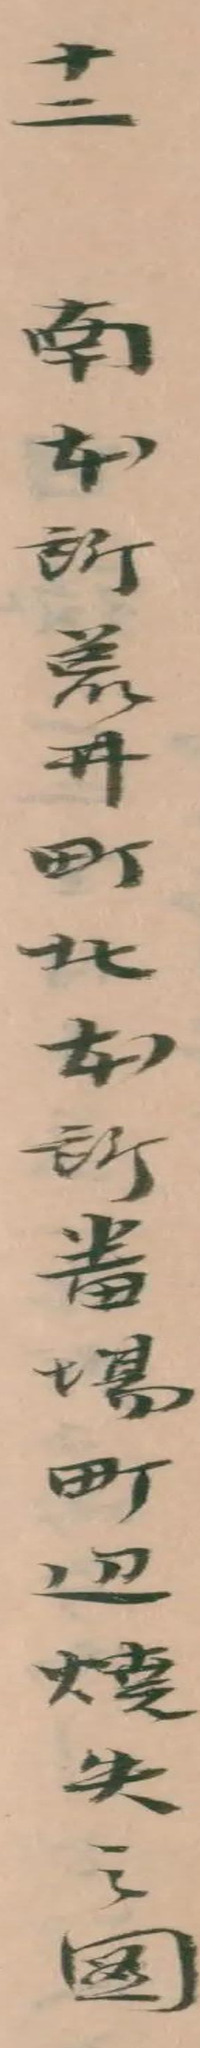十二南本所荒井町北本所番場町辺焼失之図
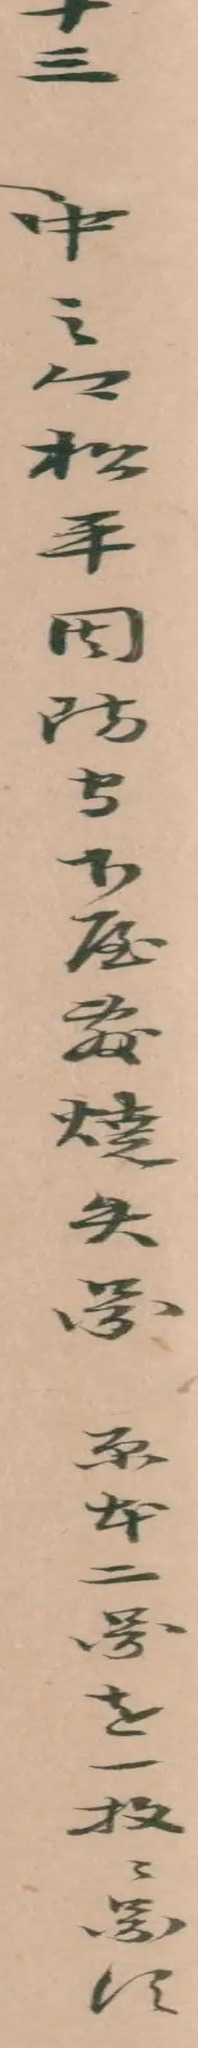十三中之郷松平周防守下屋敷焼失図原本二図を一枚に図す
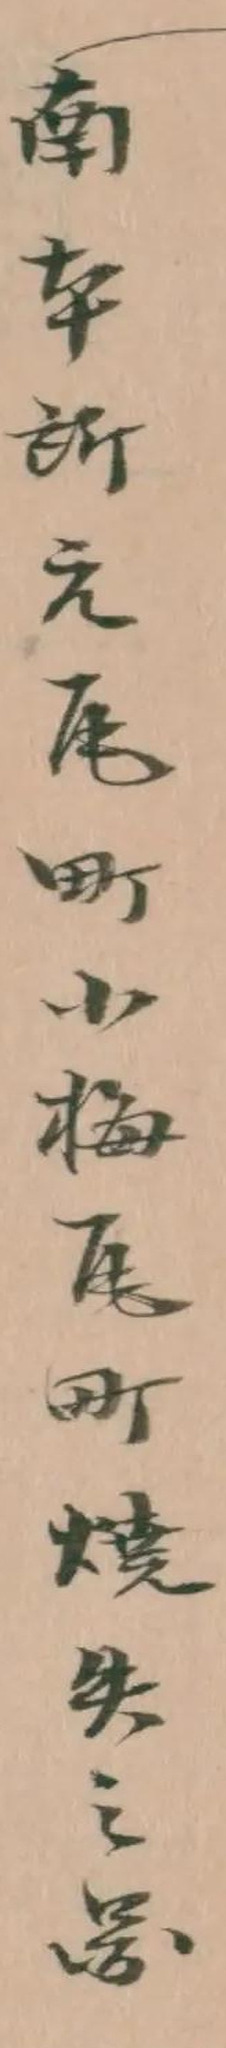南本所元瓦町小梅瓦町焼失之図
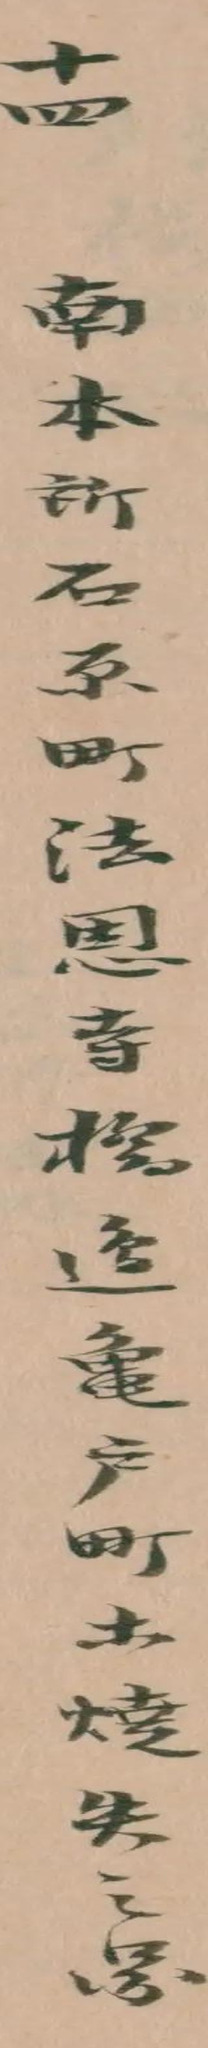十四南本所石原町法恩寺橋辺亀戸町等焼失之図
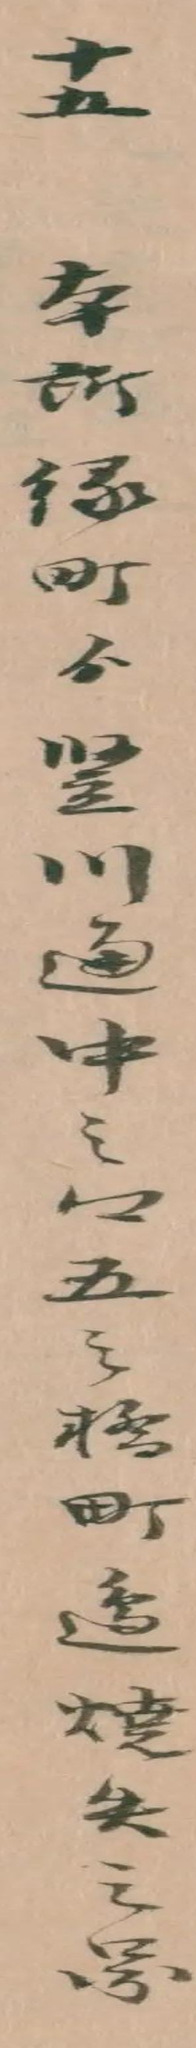十五本所縁町ゟ堅川通中之郷五之橋町辺焼失之図
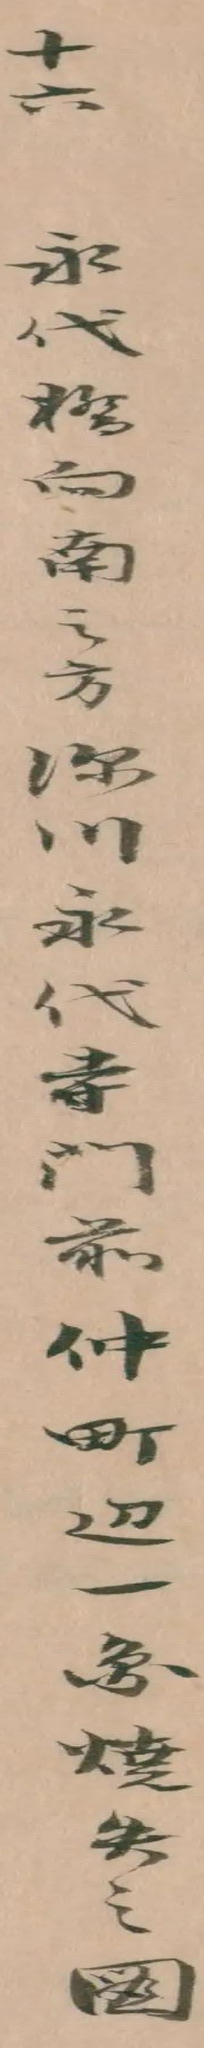十六永代橋向南之方深川永代寺門前仲町辺一円焼失の図
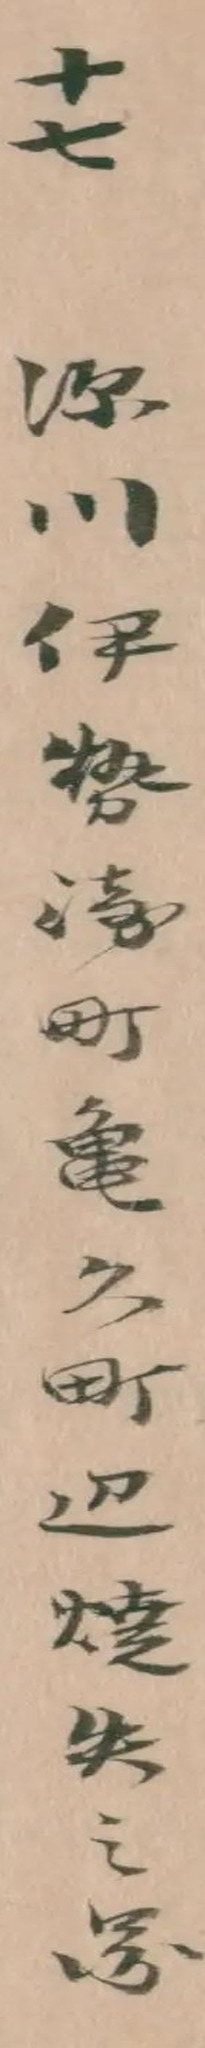十七深川伊勢崎町亀久町辺焼失之図
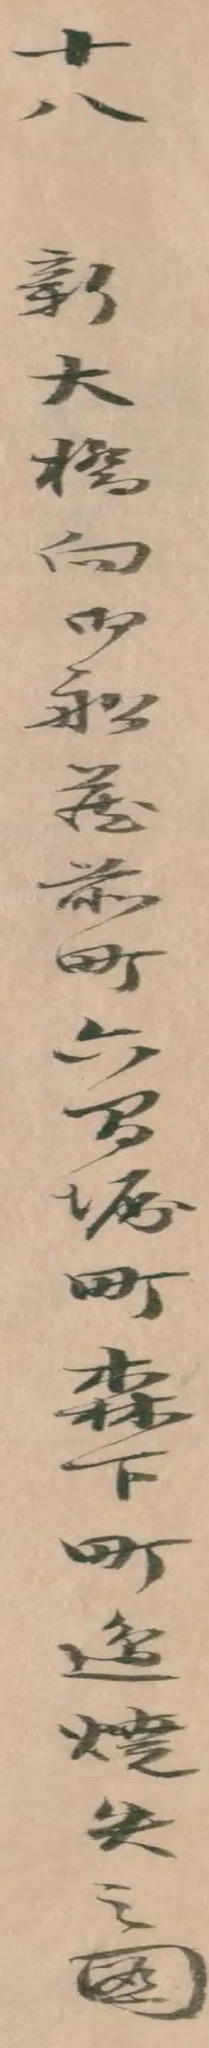十八新大橋向御船蔵前町六間堀町森下町辺焼失之図
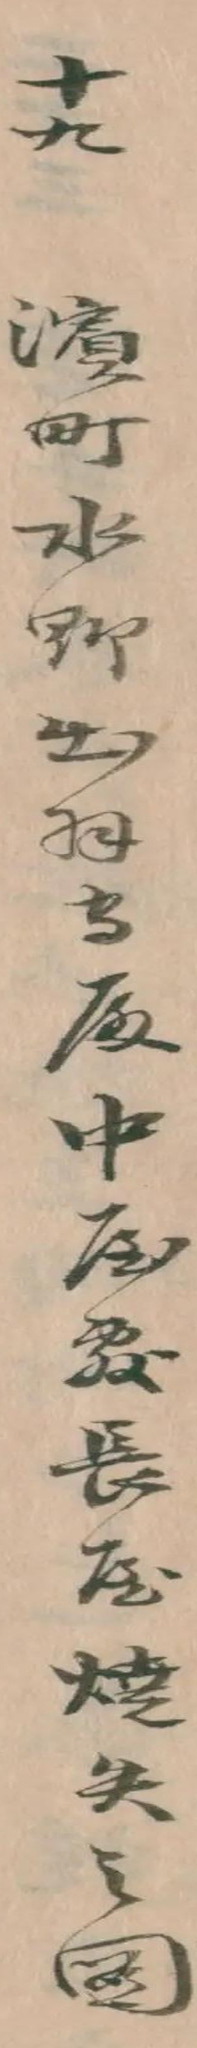十九浜町水野出羽守殿中屋敷長屋焼失之図
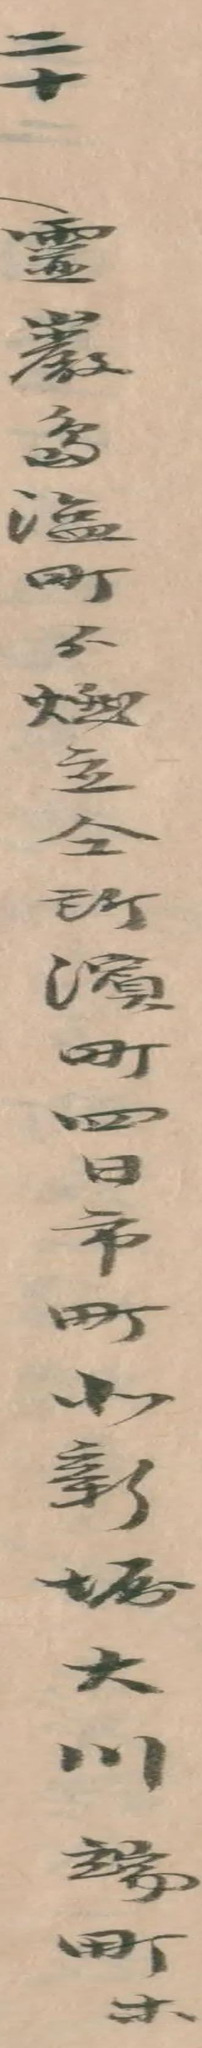二十霊巖島塩町ゟ燃立仝所浜町四日市町北新堀大川端町等
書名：地災撮要. 巻7-9(地震之部)
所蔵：国立国会図書館 National Diet Library, JAPAN
